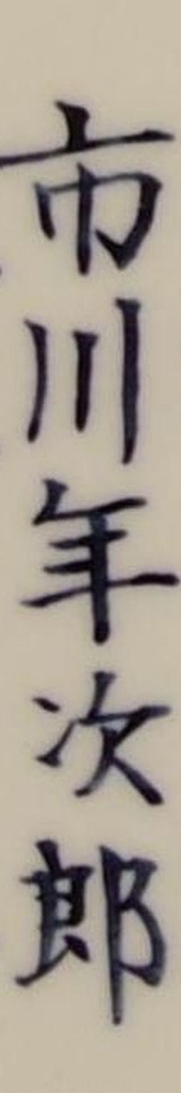市川年次郎
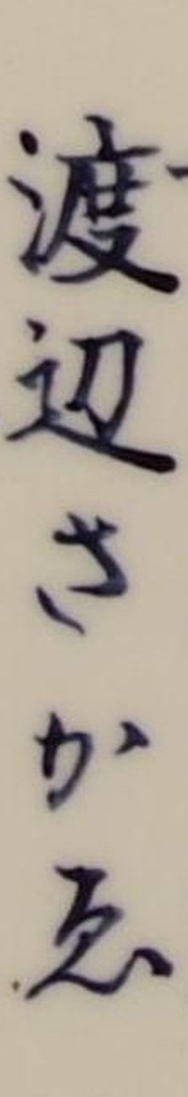渡辺さかゑ
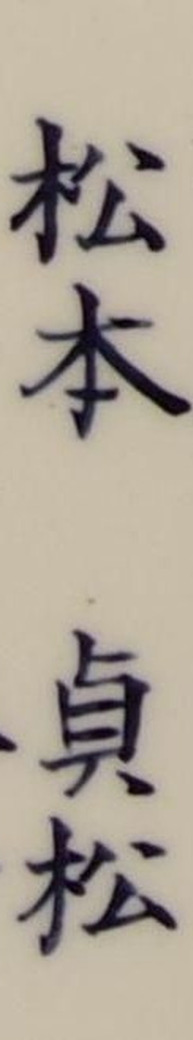松本貞松
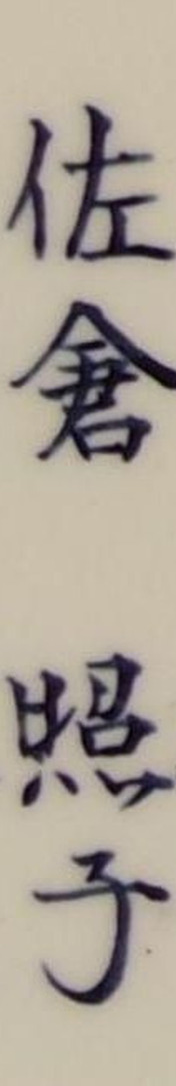佐倉照子
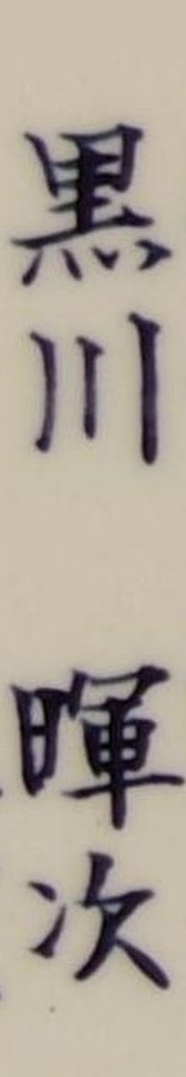黒川暉次

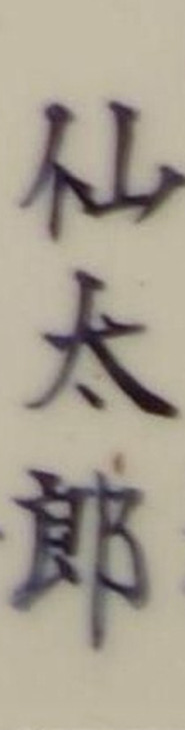仙太郎
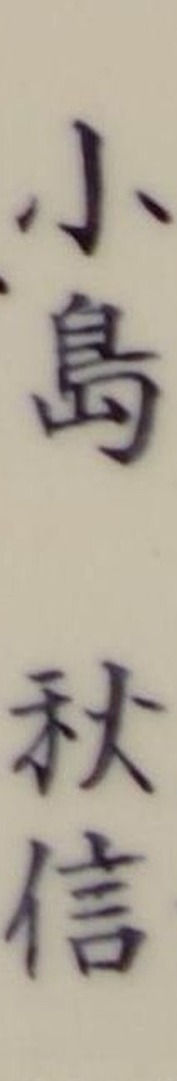小島秋信
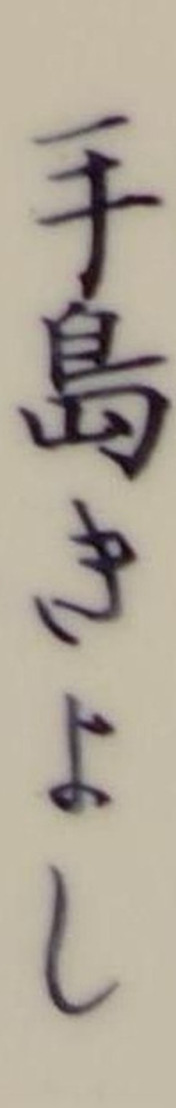手島きよし
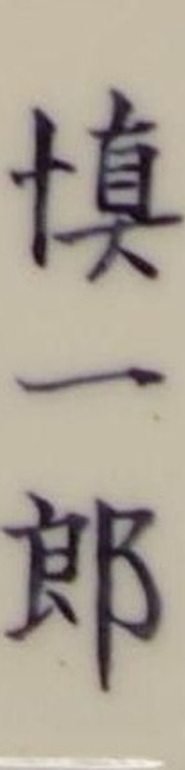慎一郎
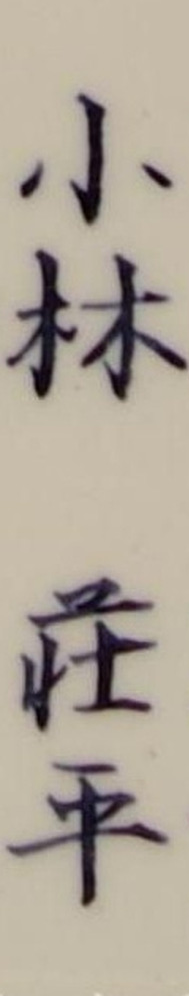小林荘平
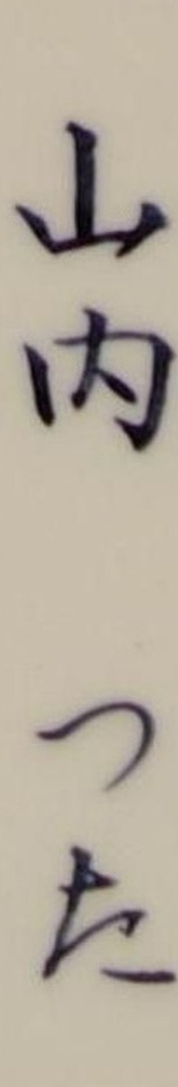山内つた
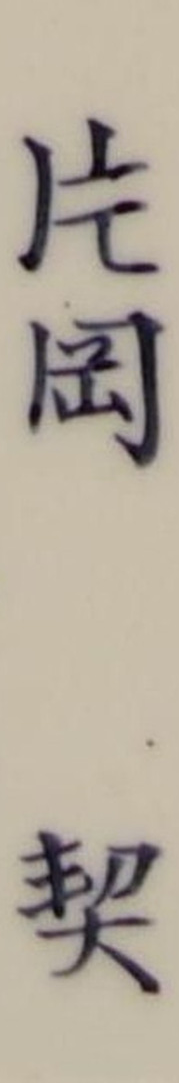片岡契
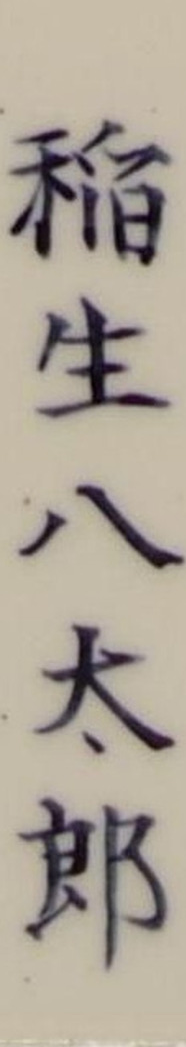稲生八太郎
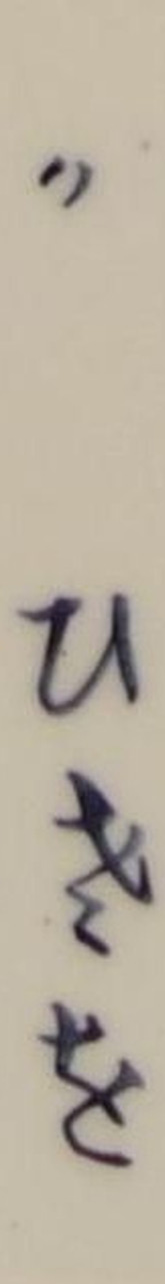ひさを
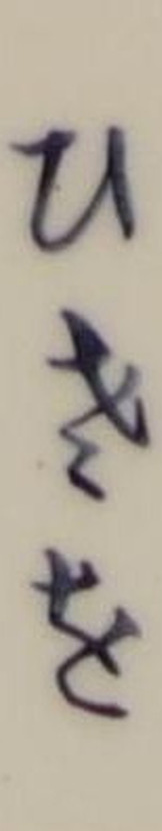ひさを
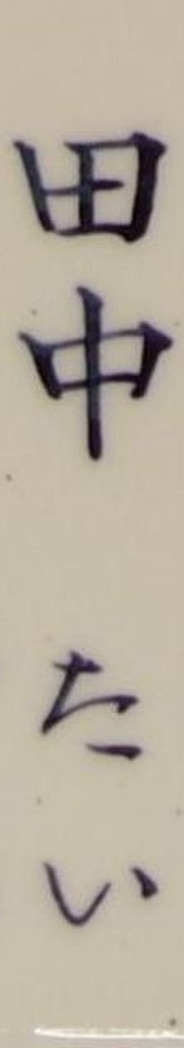田中たい
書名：M~S
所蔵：高野山金剛峯寺
